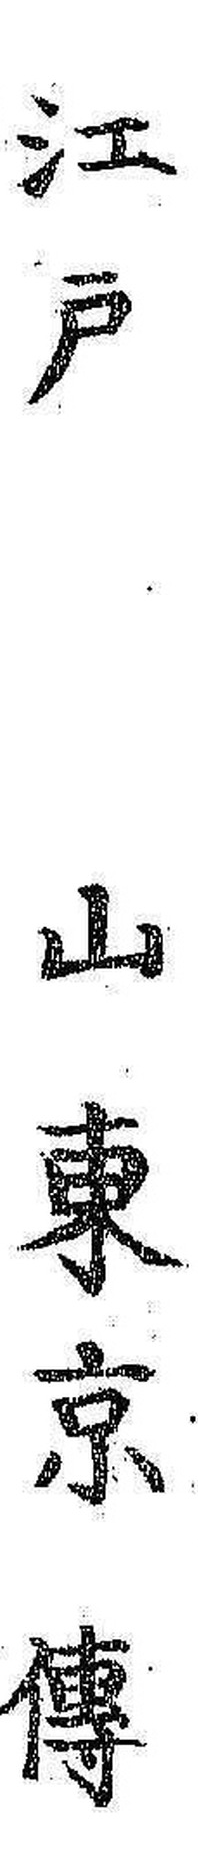江戸山東京伝
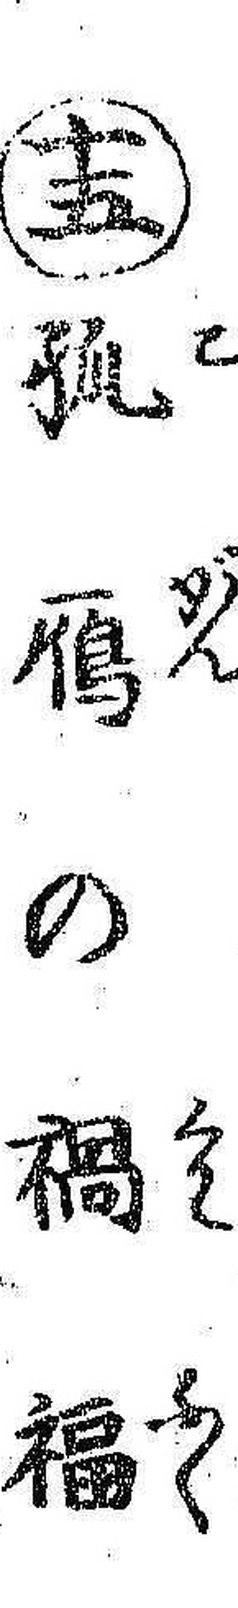十五孤雁の禍福
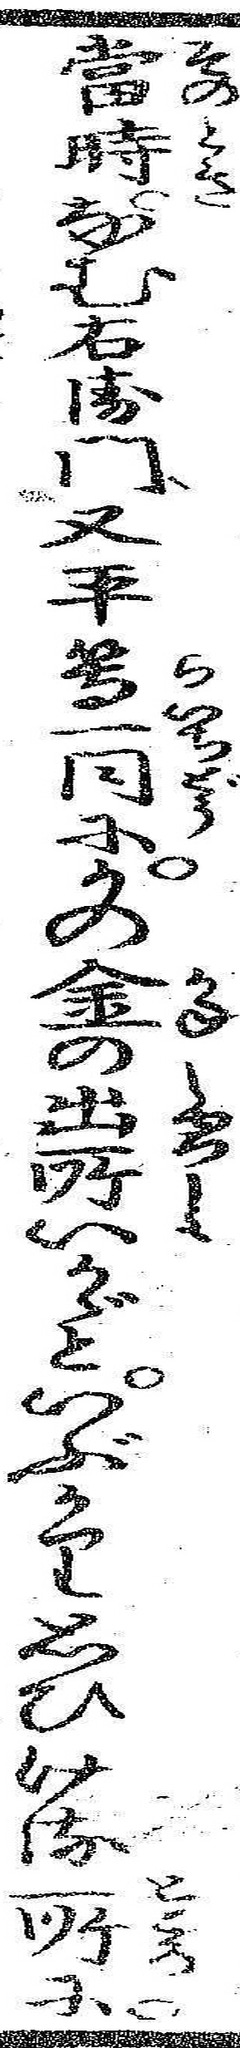当時。なむ右衛門又平等一同に。かの金の出所いかゞと。いぶかり思ひける所に。
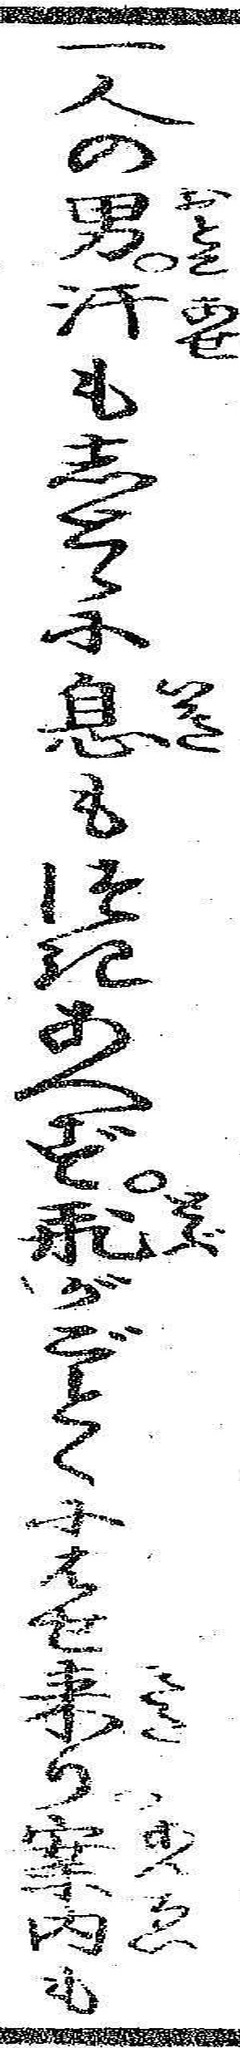一人の男。汗もしとゝに息もつきあへず。飛がごとくにはせ来り。案内も
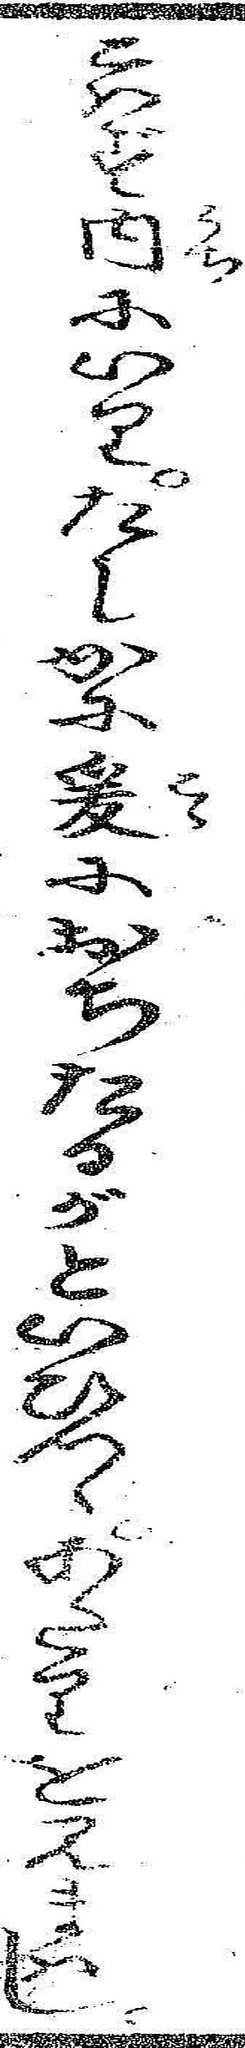こはず内にいり。たしかに爰におちたるがといひつゝ。あたりを見まはし。
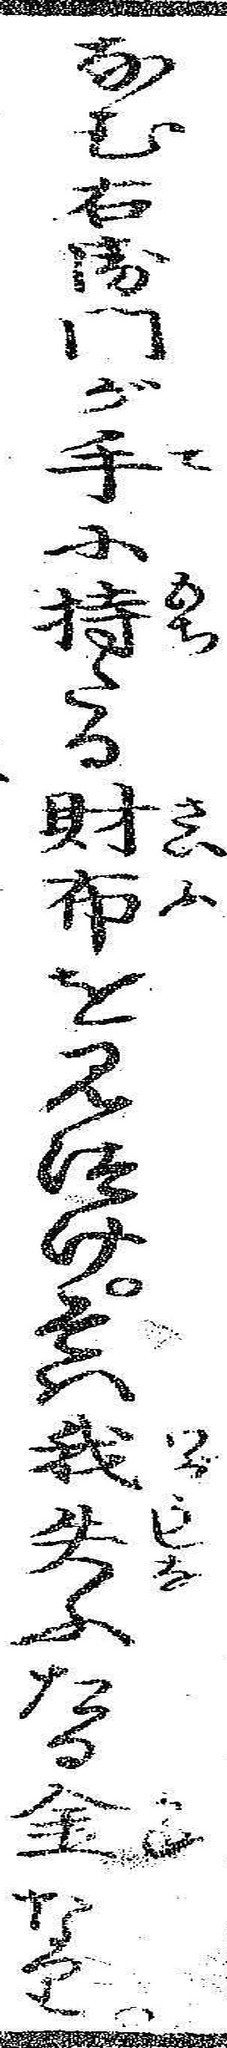なむ右衛門が手に持たる財布を見つけ。そは我失ふたる金なり。
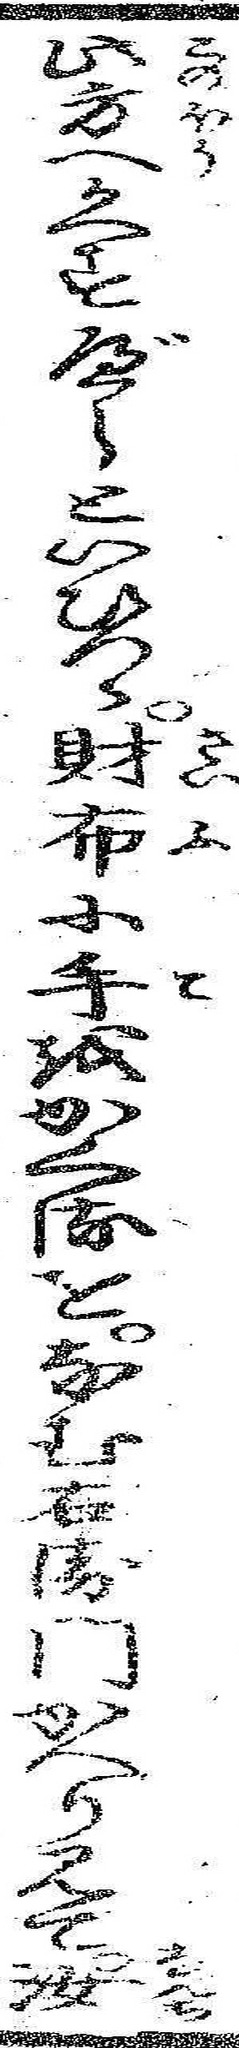此方へかへすべしといひつゝ。財布に手をかくるを。なむ右衛門かへり見て。汝
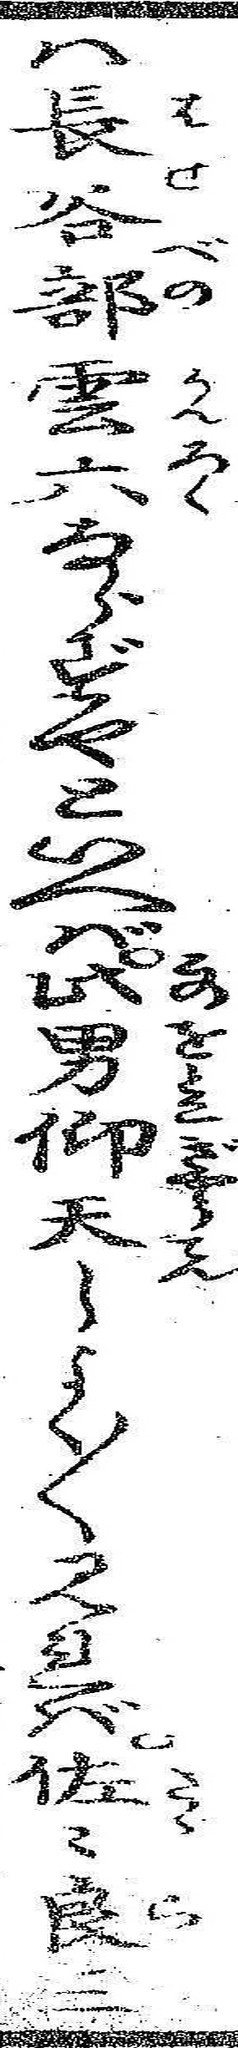は長谷部雲六ならずやといへば。此男仰天しよく〳〵見れば。佐々良三
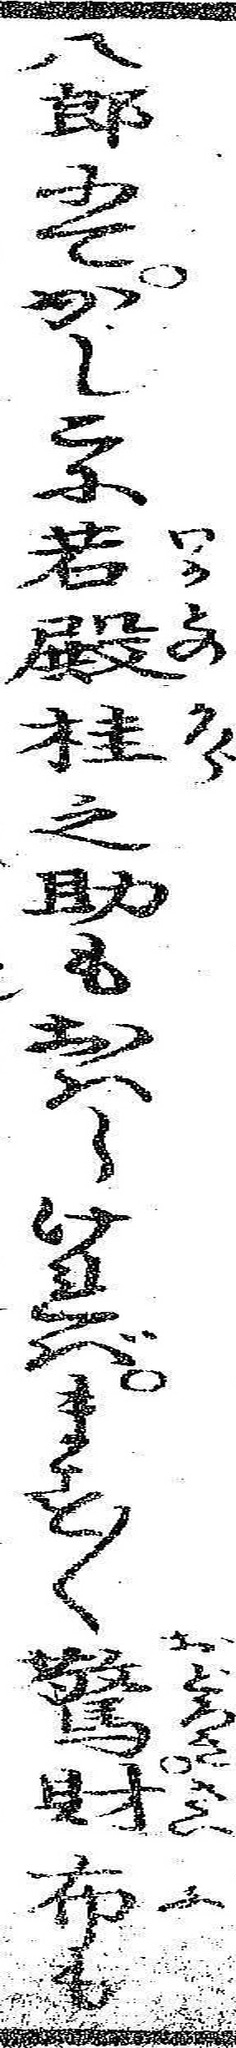八郎にて。かしこに若殿桂之助もおはしければ。ます〳〵驚。財布も
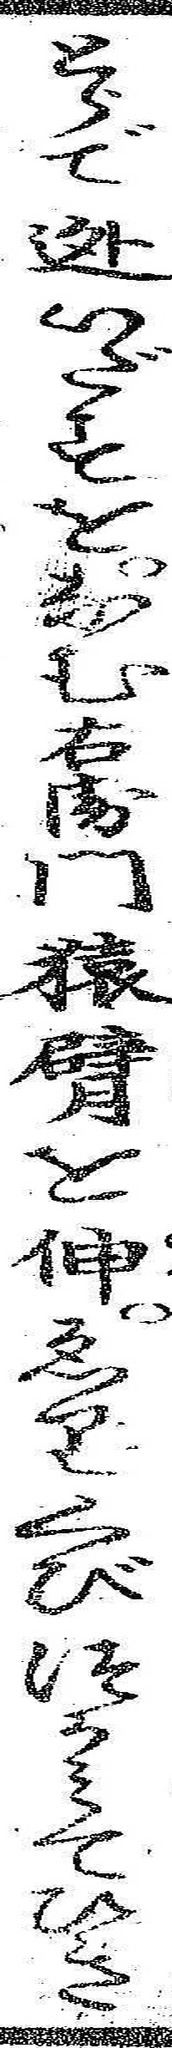とらで逃いだすを。なむ右衛門猿臂を伸。ゑりくびつかみてひき

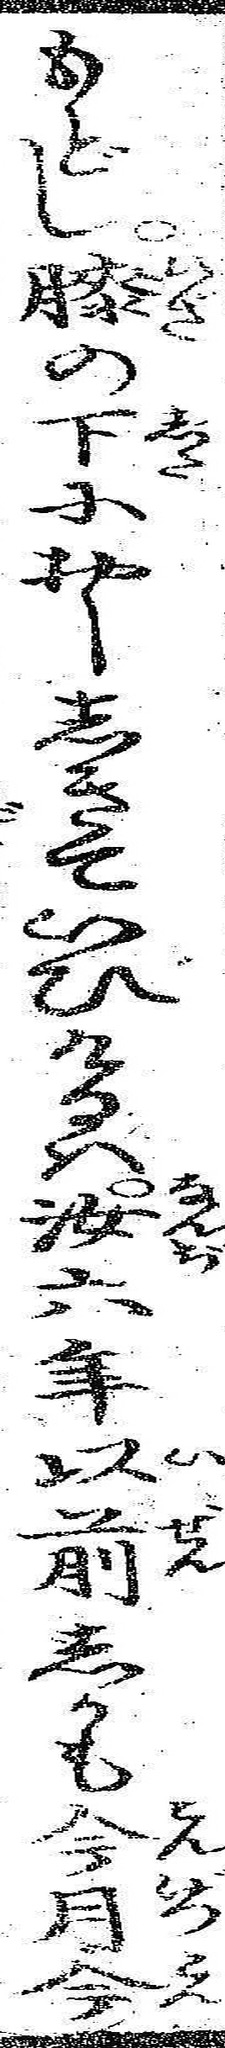もどし。膝の下におししきていひけるは。汝六年以前しかも今月今
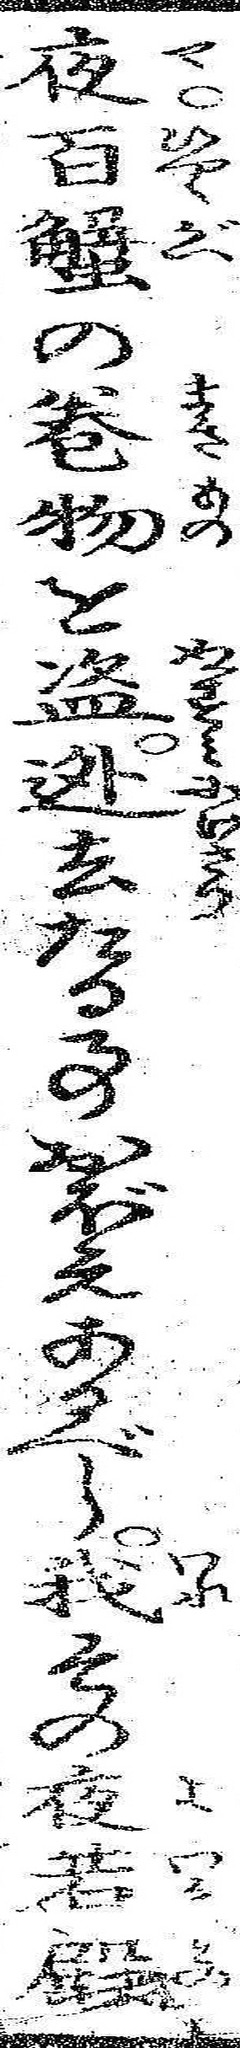夜。百蟹の巻物を盗。逃去たる事おぼえあるべし。我その夜若殿
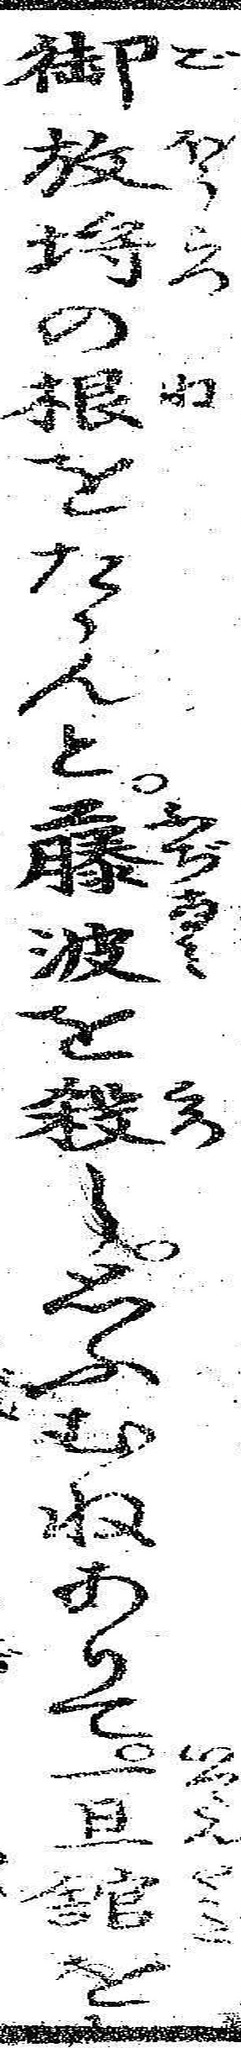御放埓の根をたゝんと。藤波を殺し。思ふむねありて。一旦館を
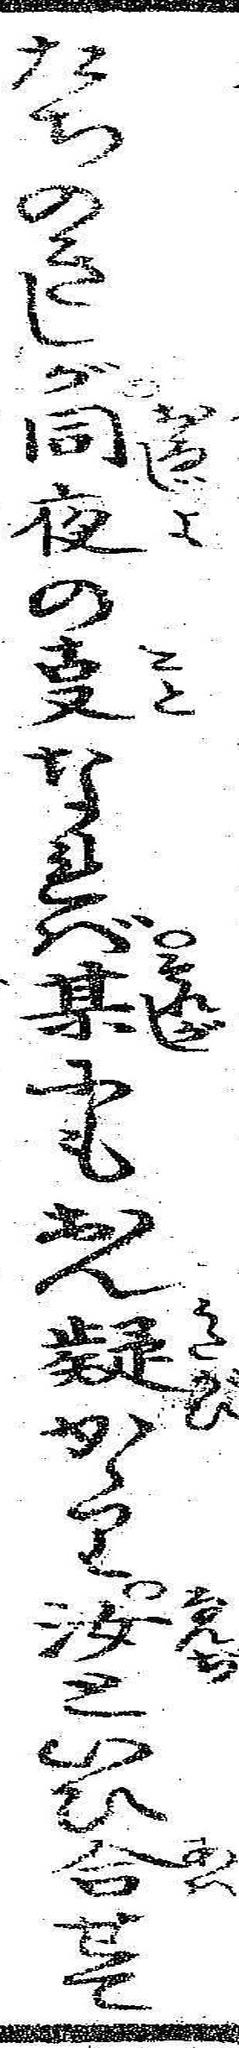たちのきしが。同夜の事なれば。某にもおん疑かゝり。汝といひ合せて
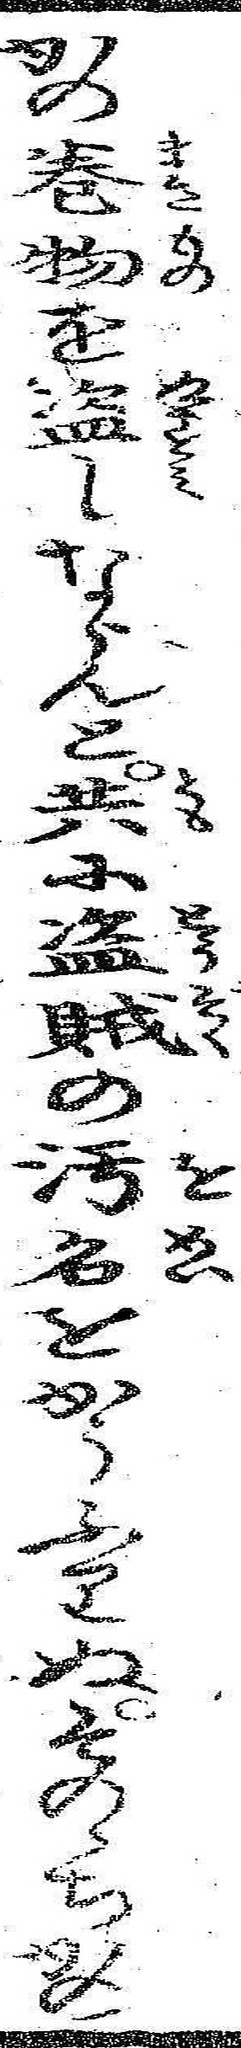かの巻物を盗しならんと。共に盗賊の汚名をかうふりぬ。そのゝちかの
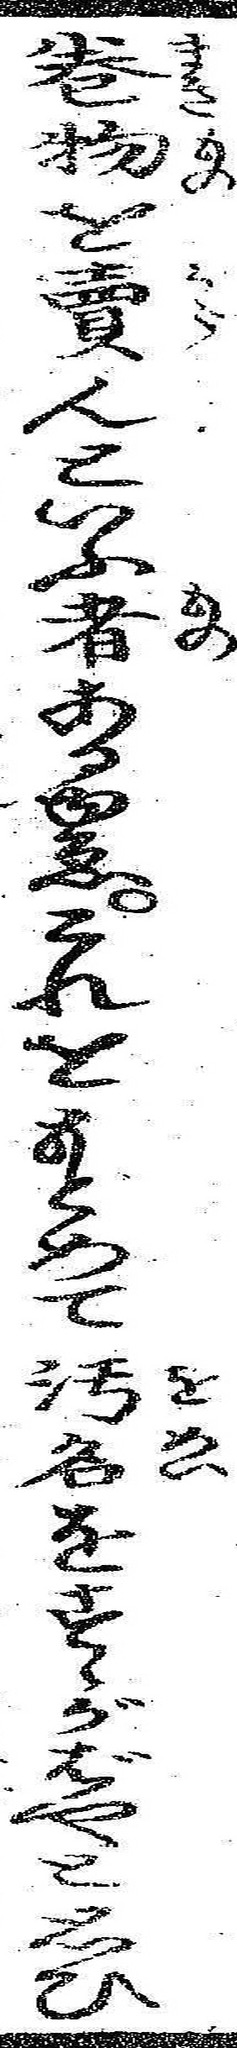巻物を売んといふ者あるゆゑ。これをもとめて汚名をすゝがばやと思ひ
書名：昔話稲妻表紙
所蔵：国文学研究資料館
